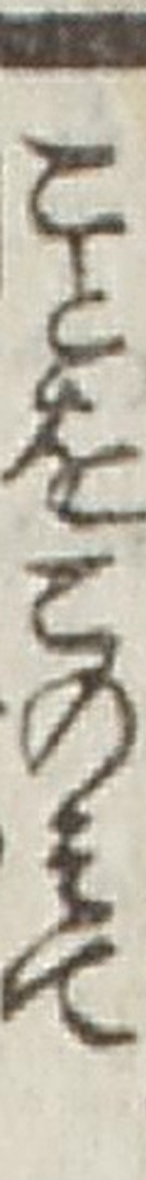ことをこのみて
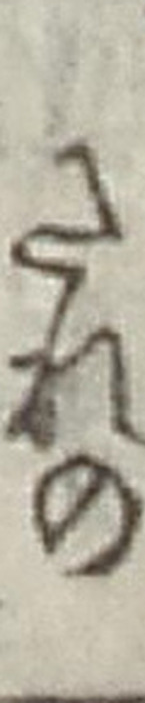たれの
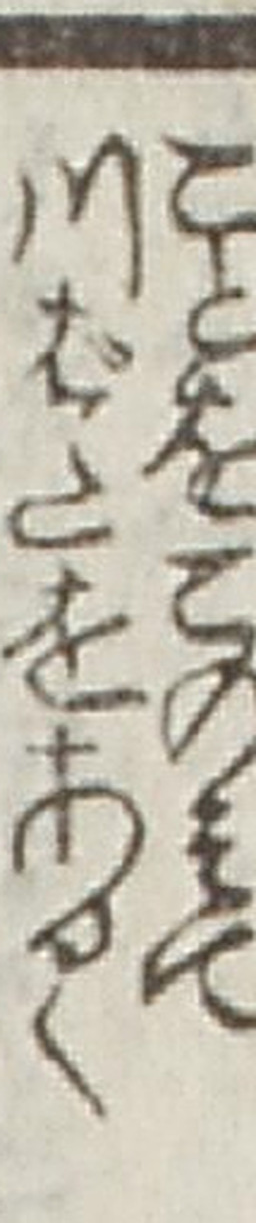川ばたをあるく
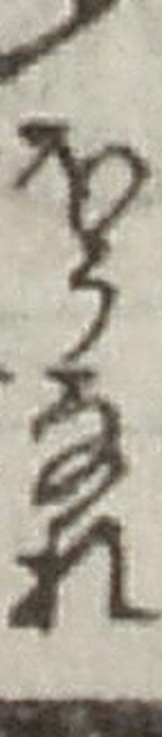ほうなれ
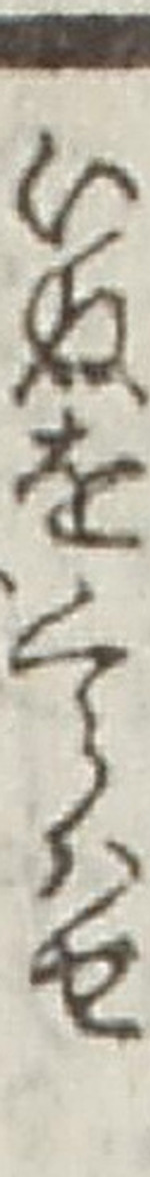いぬをくらはせ
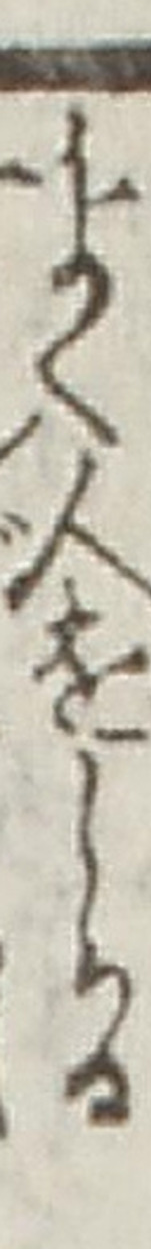よく人をしかる
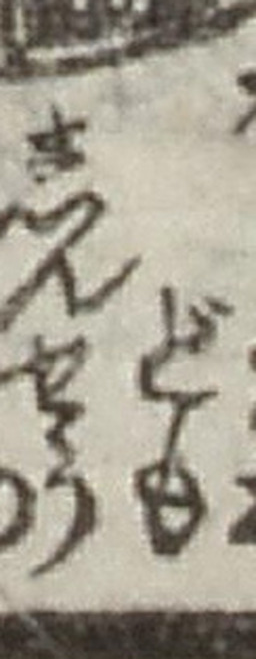しんせう
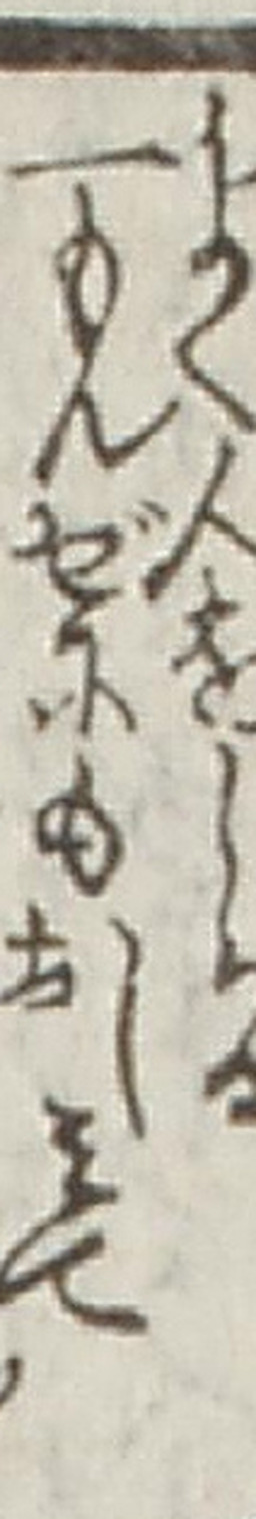一もんぜにもおしみて
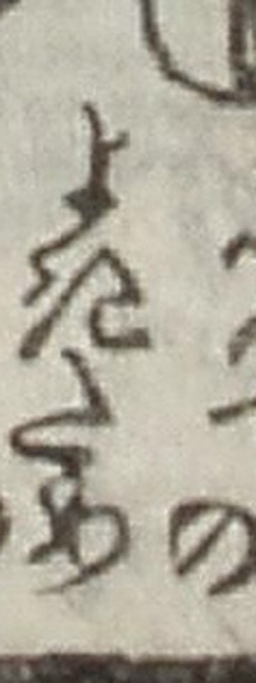よきため
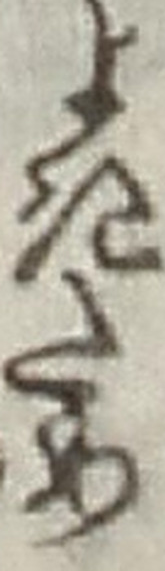よきため
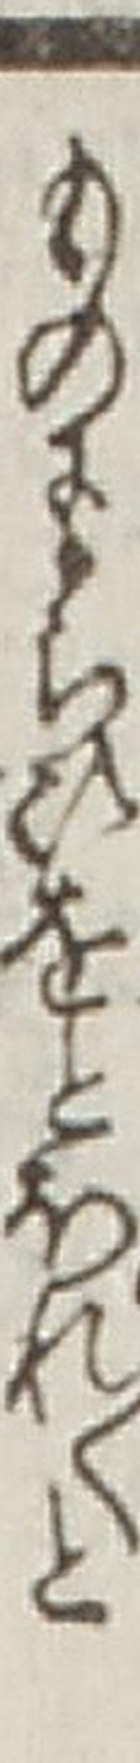ものも？らひをとほれ〳〵と
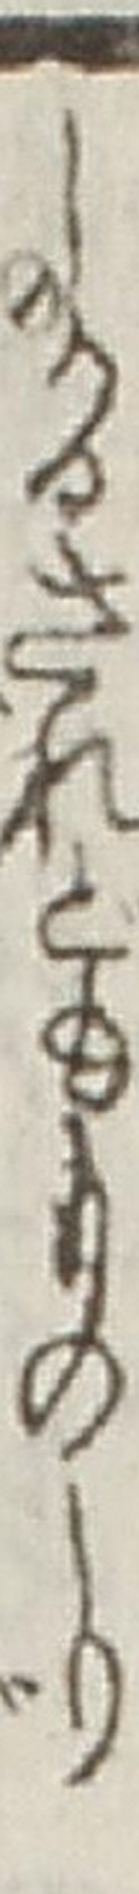しけるされどもものしり
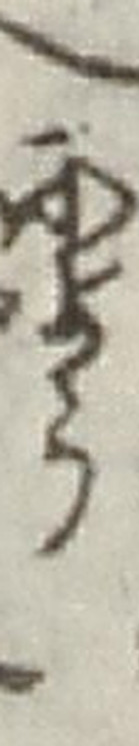によう
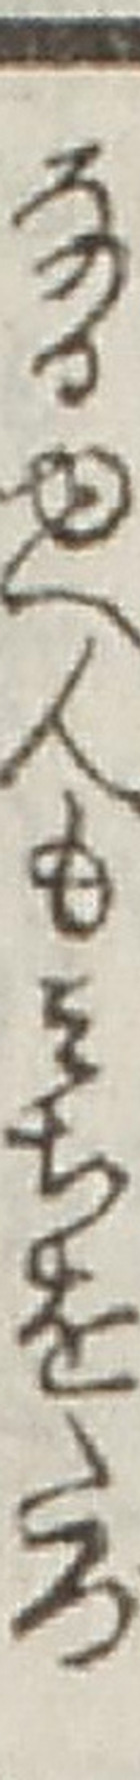なるゆへ人もみちをたづ
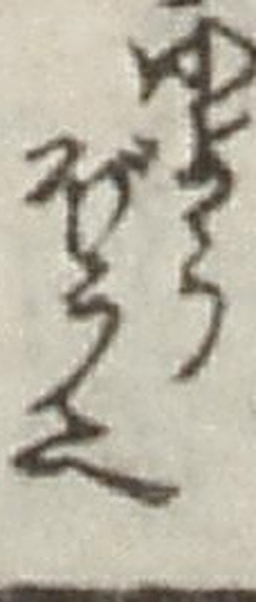ぼう也
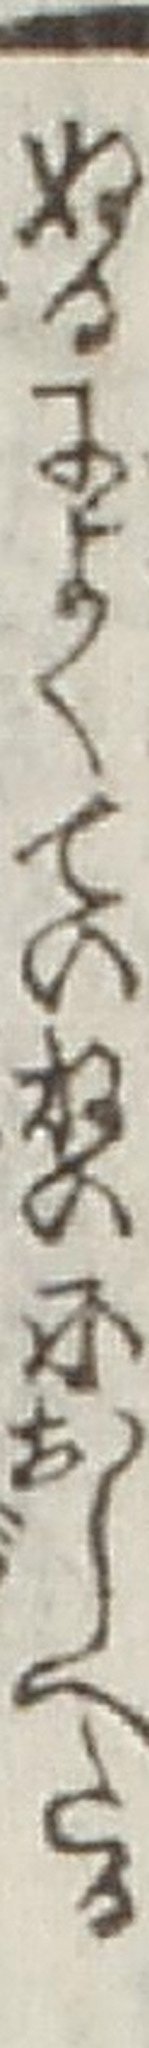ぬるによくていねいにおしへたる
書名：三世相出雲當座帳　上下冊
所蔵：東京大学地震研究所図書室 Earthquake Research Institute Library, The University of Tokyo, JAPAN
